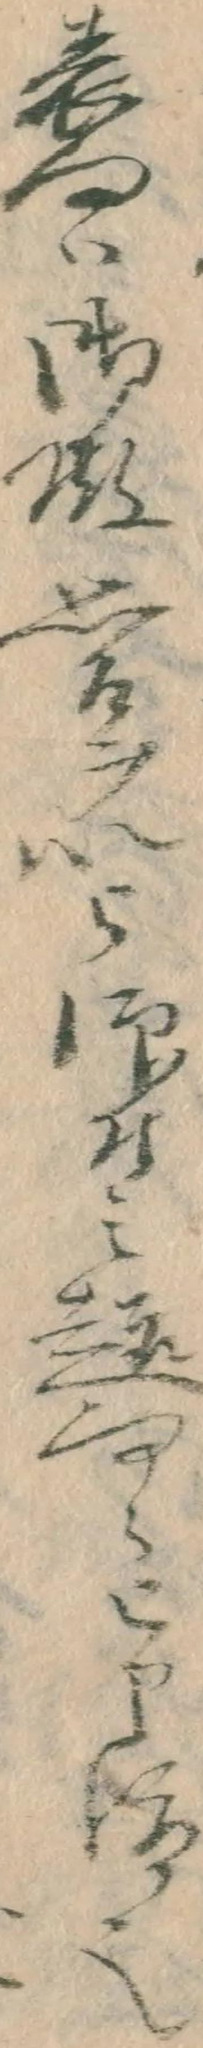表向ハ御殿思召ヲ以被仰付之趣向之被申渡也
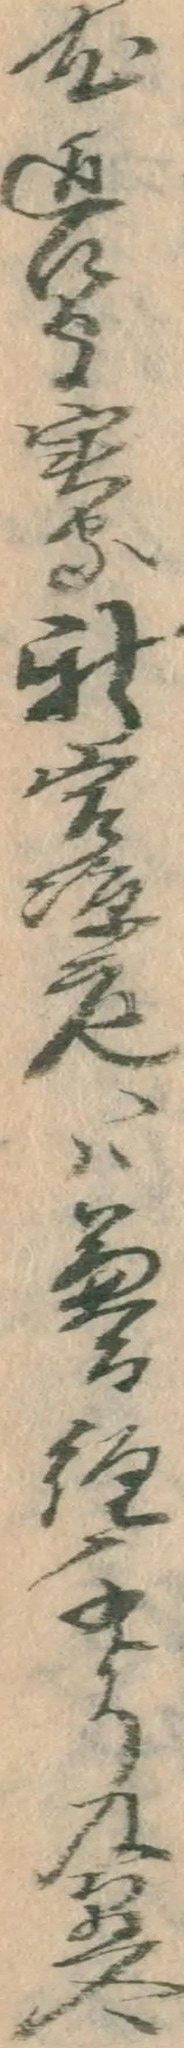尤近江守実守新宮涼庭へハ兼而経千より及懸合

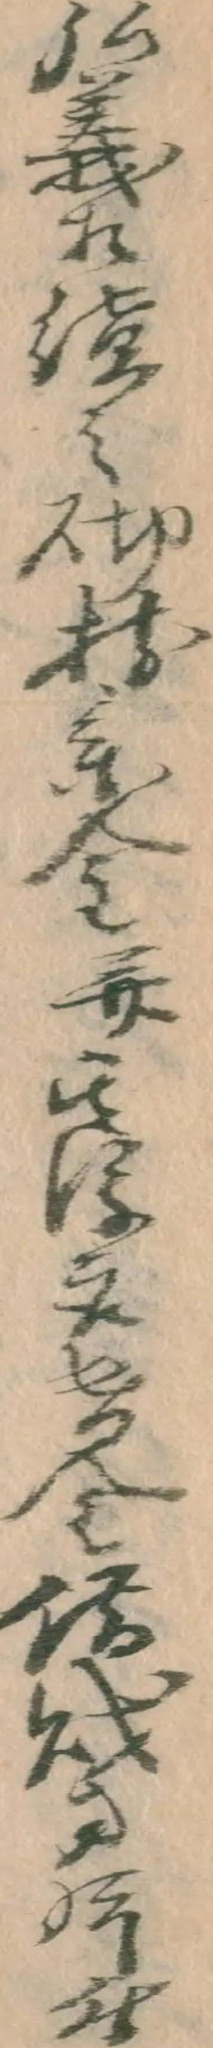弘義相續之砌持参金幷其後取替金借財方片付
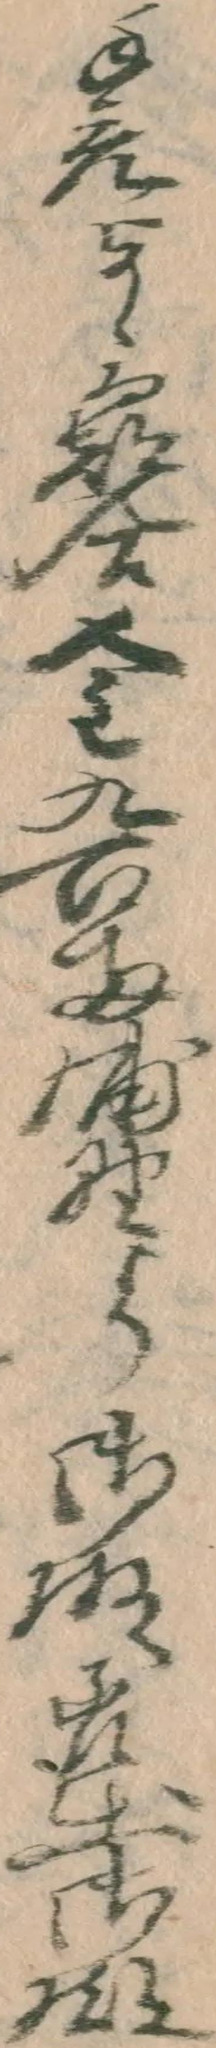手差とし而都合金九百両浦野より御殿へ差出御殿
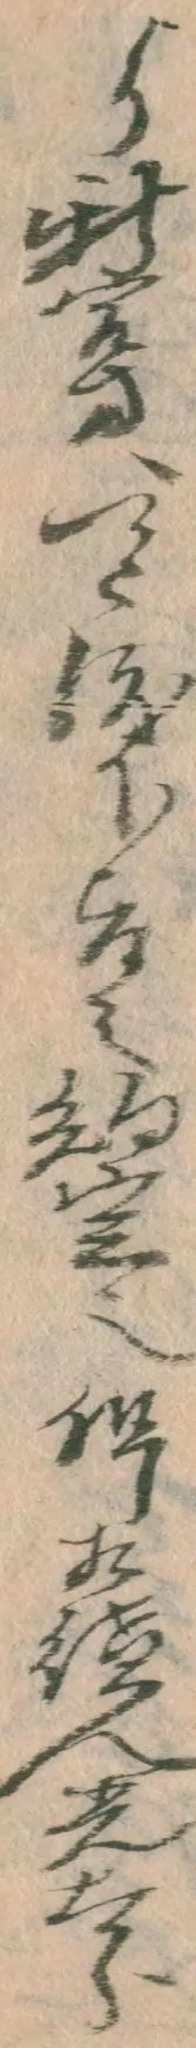より新宮方へ可被渡下旨之約定也但し相続人光太郎
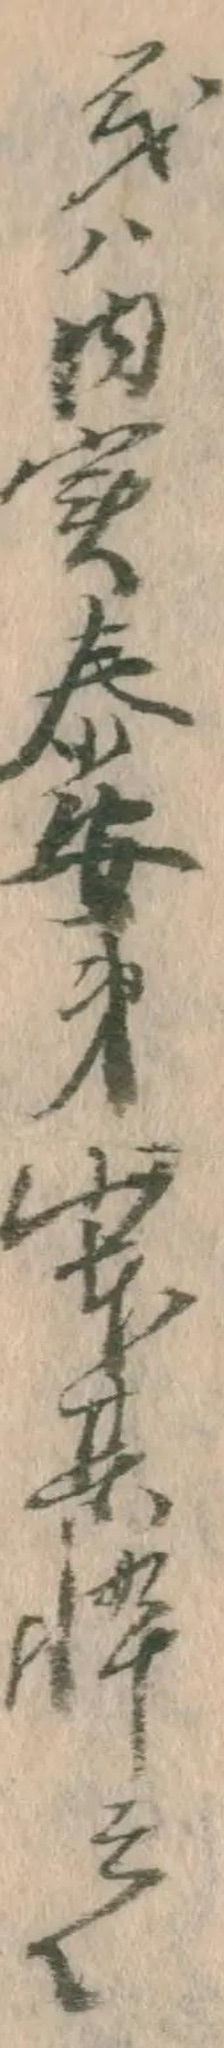義は内実泰安弟山本某忰云々
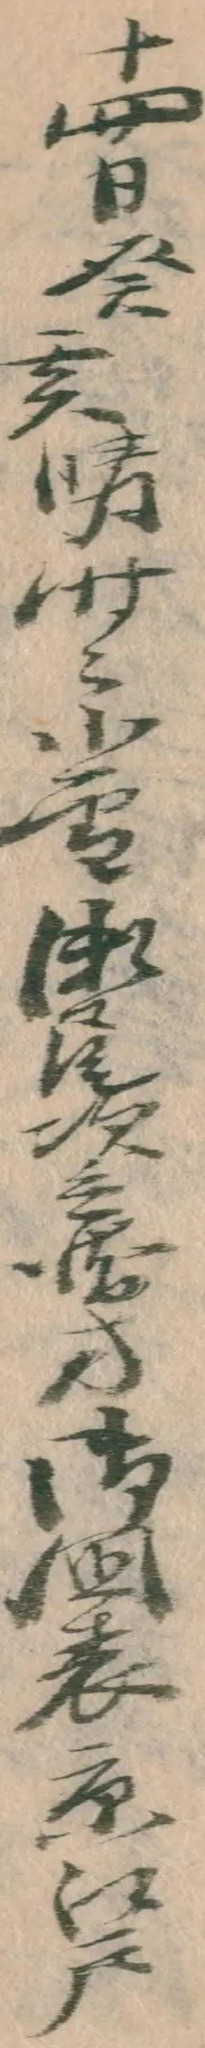十四日癸亥晴時々小雪瀬尾次兵衛方御国表京江戸
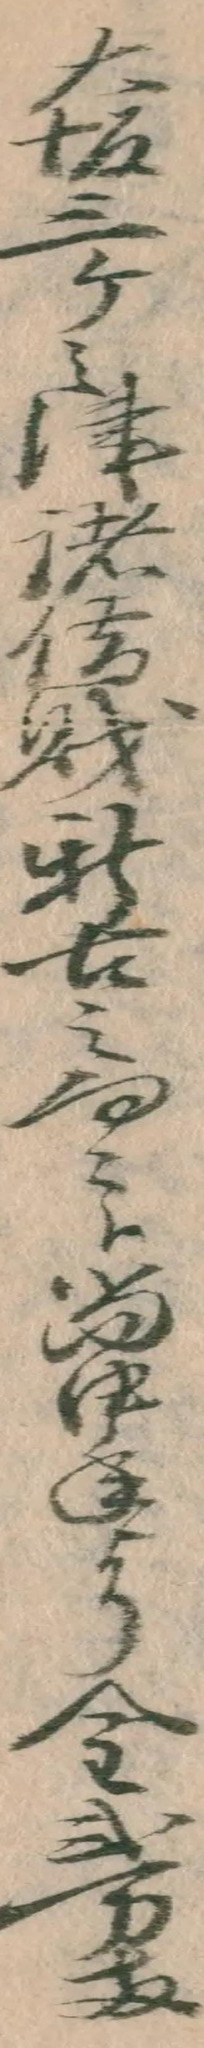大坂三ヶの津諸借財新古之向々え當申年より金弐万両
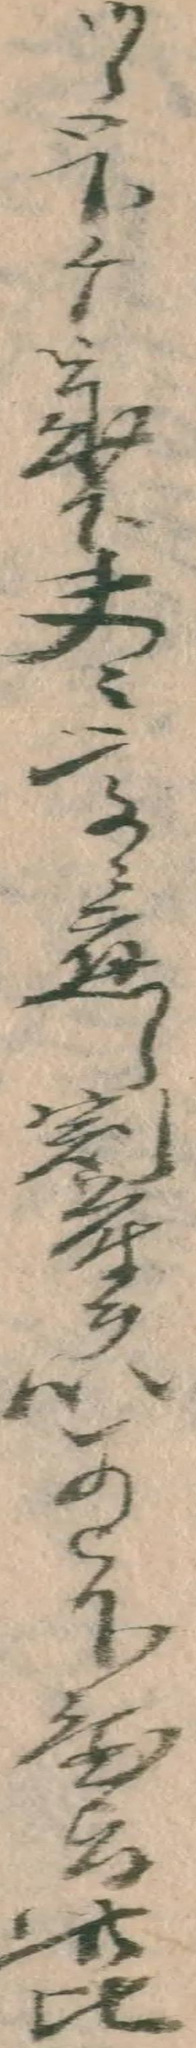ツヽ御下ケ被成下夫々高ニ應し割符ヲ以可被下置旨此比
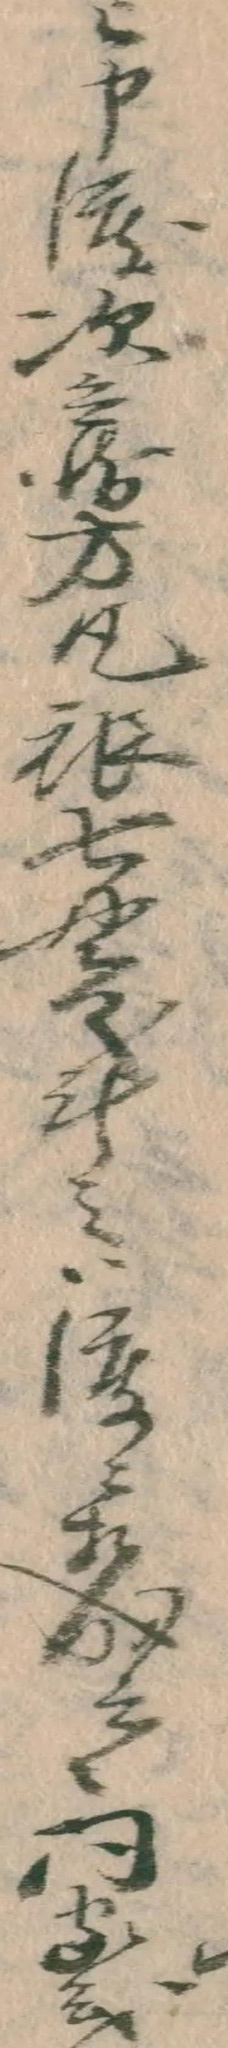被申渡次兵衛方凡銀七貫匁計之ハ渡ニ相成候云々同家義
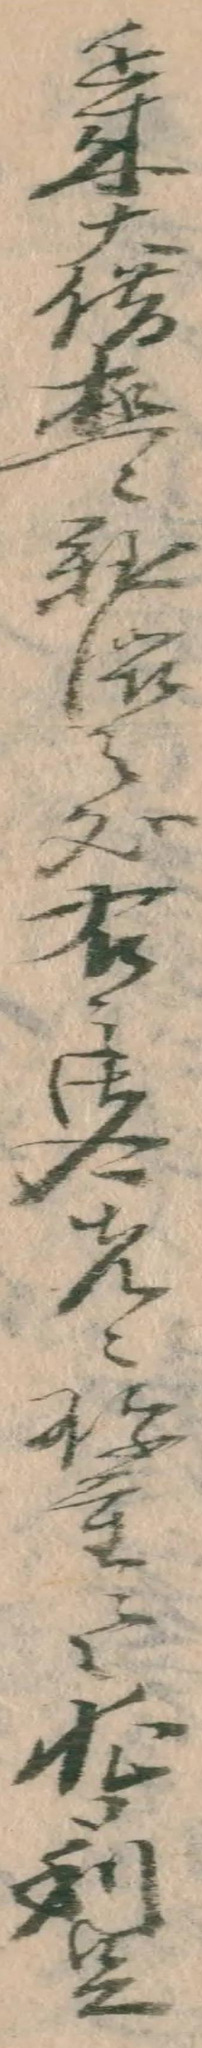近来大借直二難渋之処右之仕合先々珍重々々非御利足
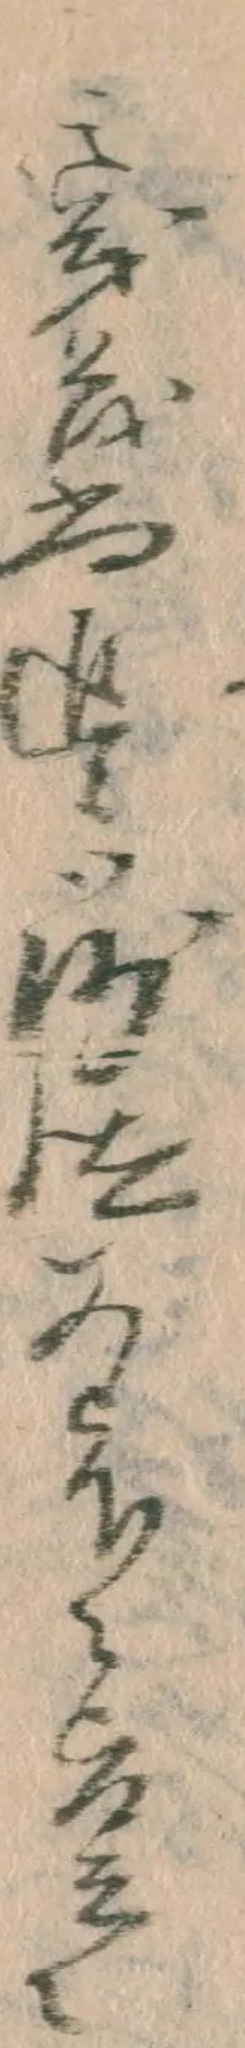之義も尚追々御沙汰可被下候旨云々
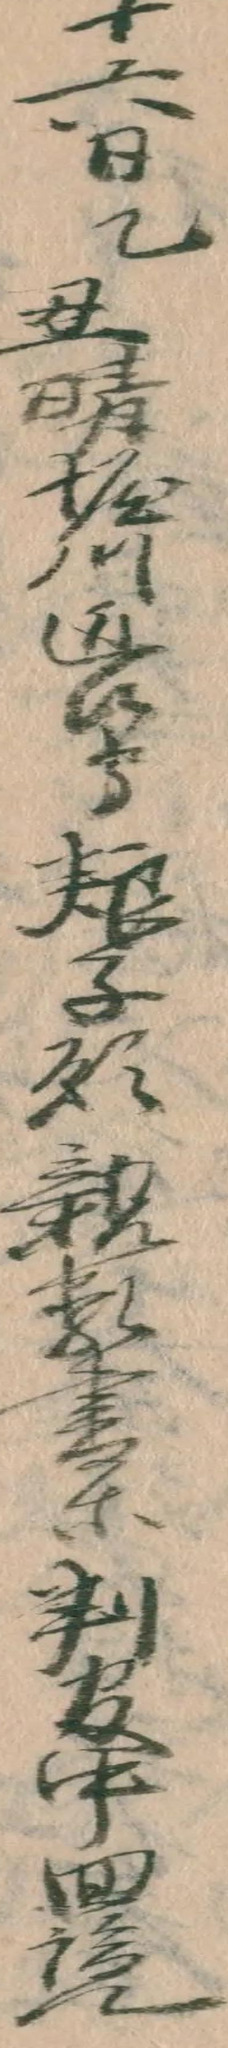十六日乙丑晴堀川近江守養子願親類書等判官中回覧
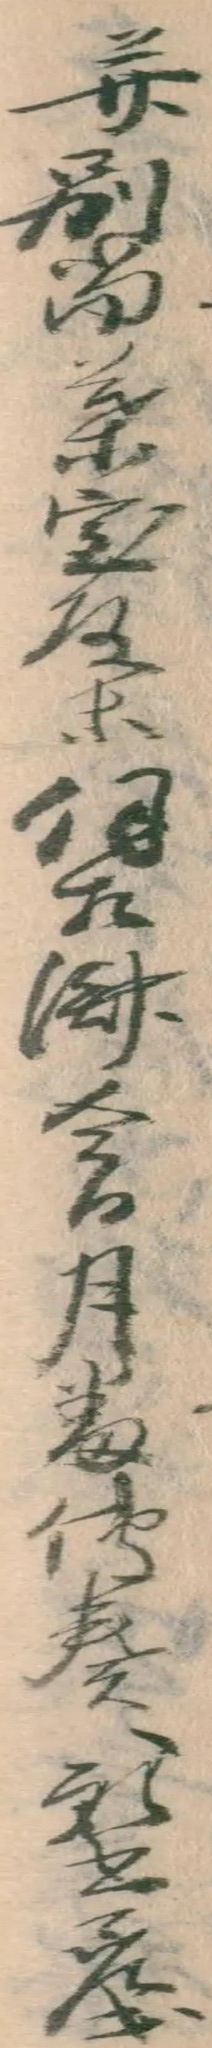并別當葉宝殿等伺相済今日月番傳奏へ願書差出
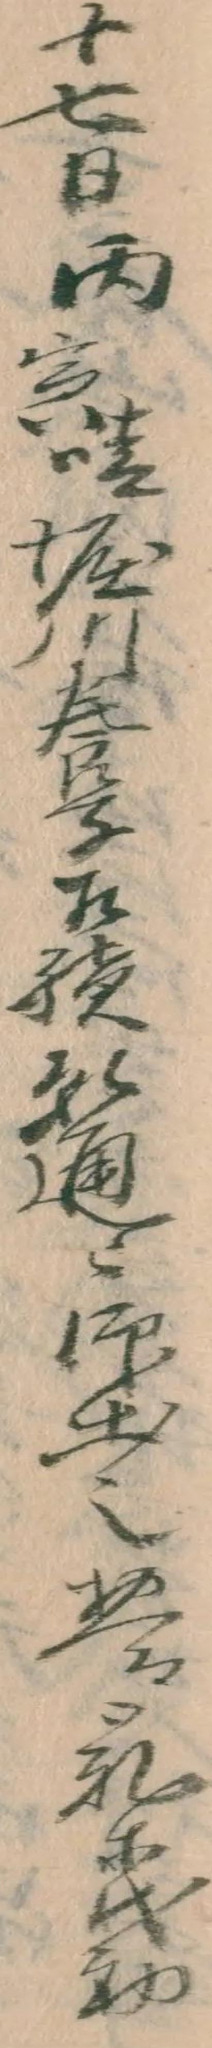十七日丙寅晴堀川養子相續願通被仰出也惣而御礼等代勤
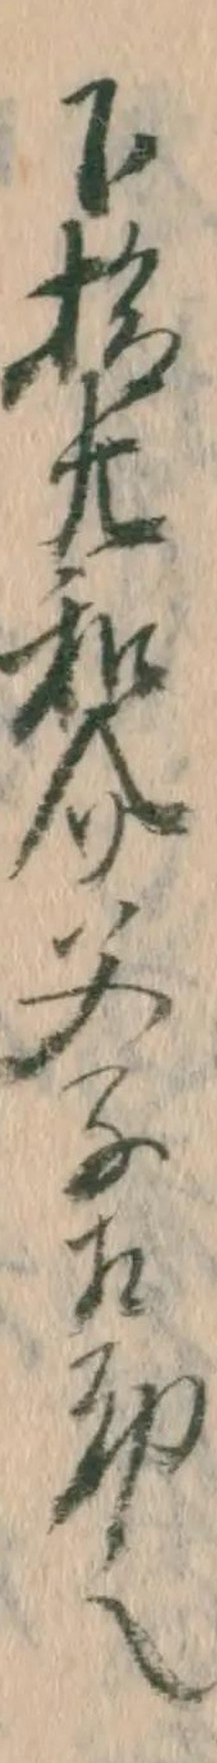下橋大和介父子相勤也
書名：賀茂社記録. 第67冊
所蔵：国立国会図書館 National Diet Library, JAPAN
